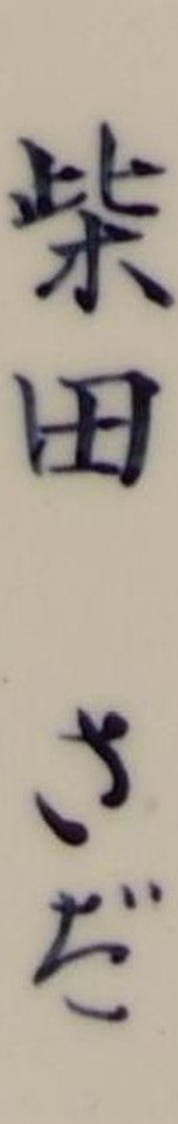柴田さだ
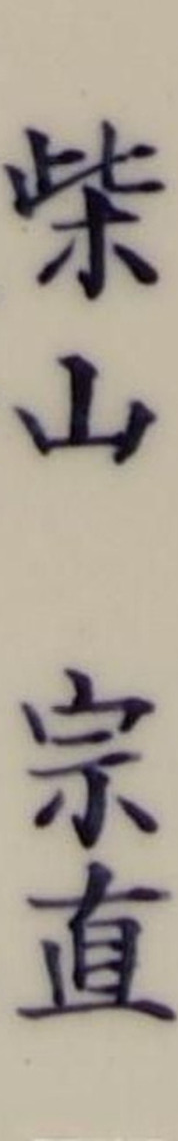柴山宗直
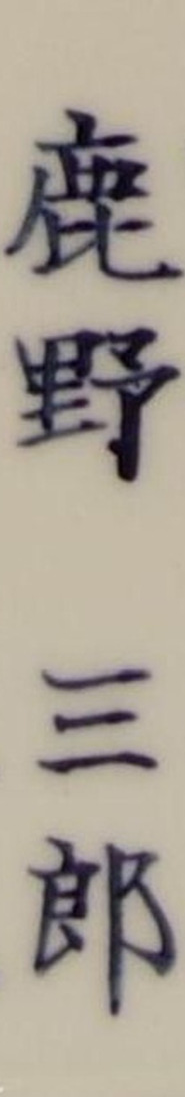鹿野三郎

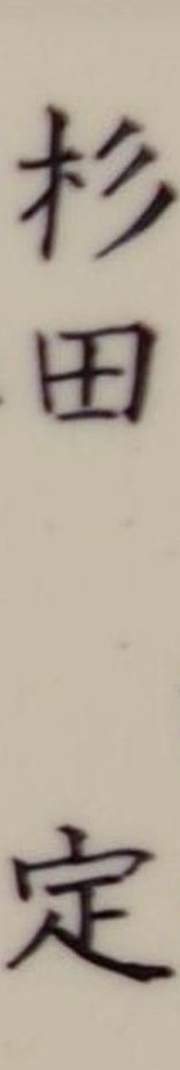杉田定
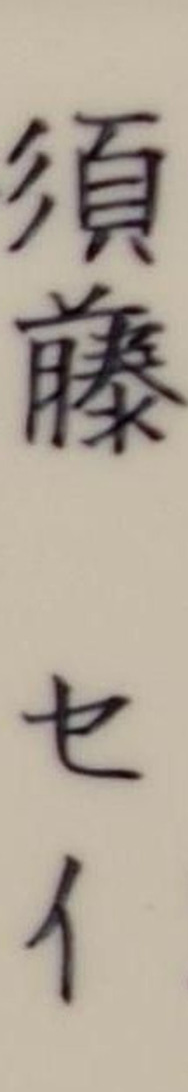須藤セイ
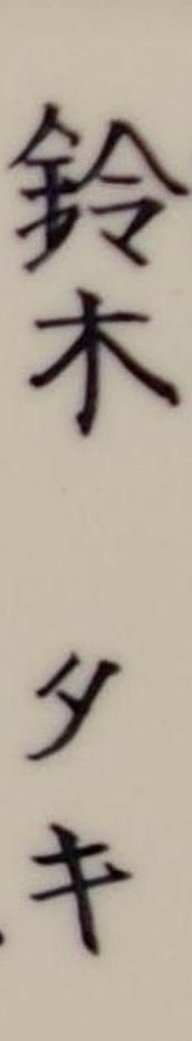鈴木タキ
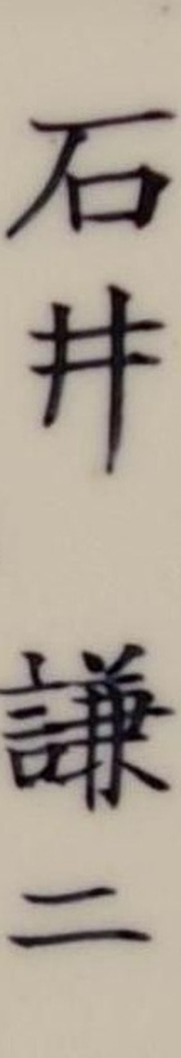石井謙二
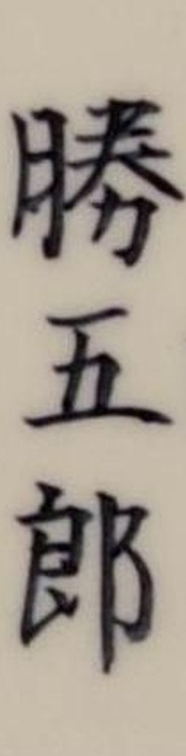勝五郎
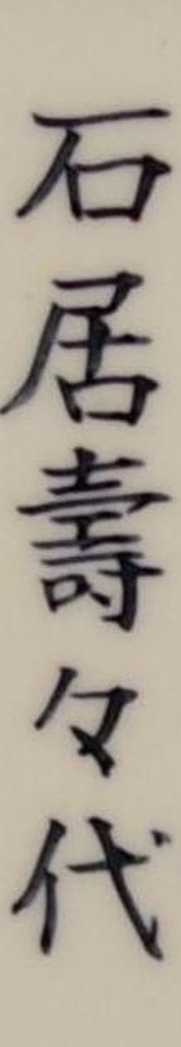石居壽々代
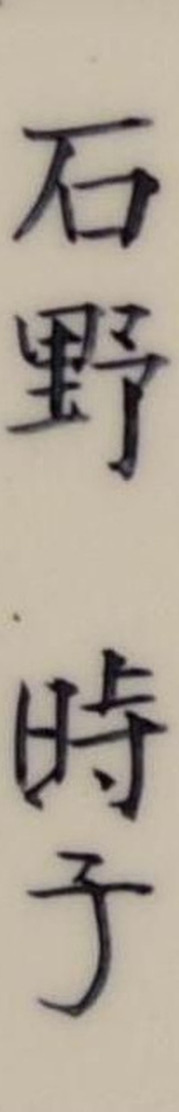石野時子
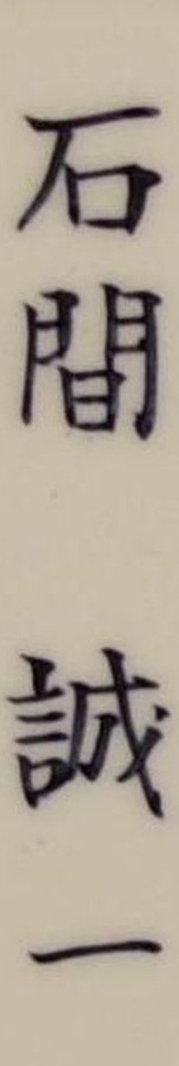石間誠一
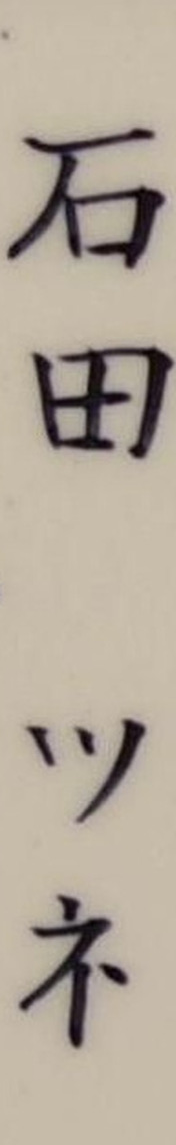石田ツネ
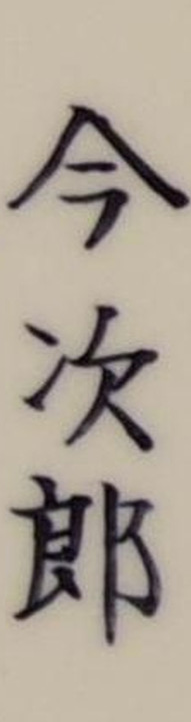今次郎
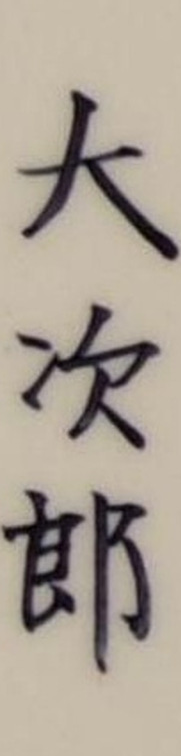大次郎
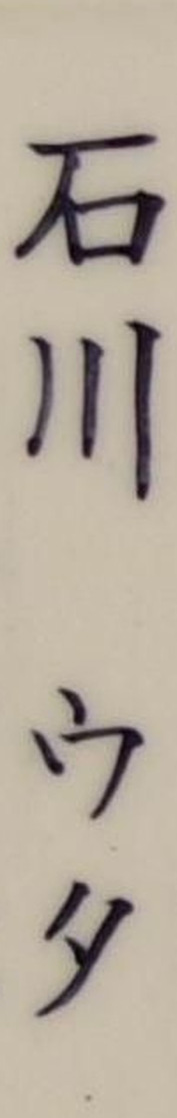石川ウタ
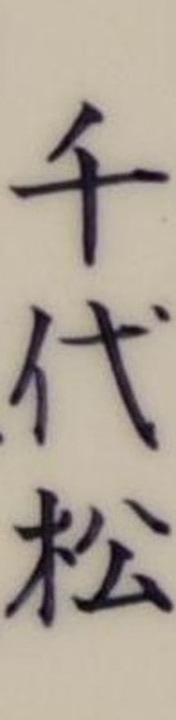千代松
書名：M~S
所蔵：高野山金剛峯寺
